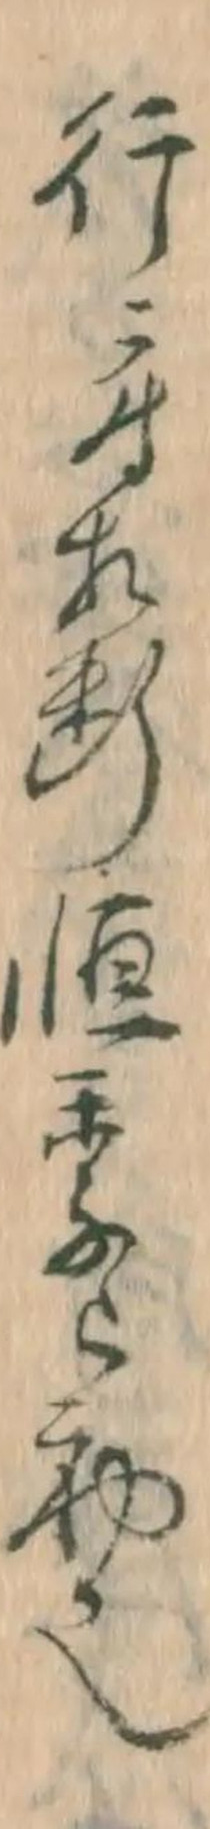行ニ付相断恒季被勤也
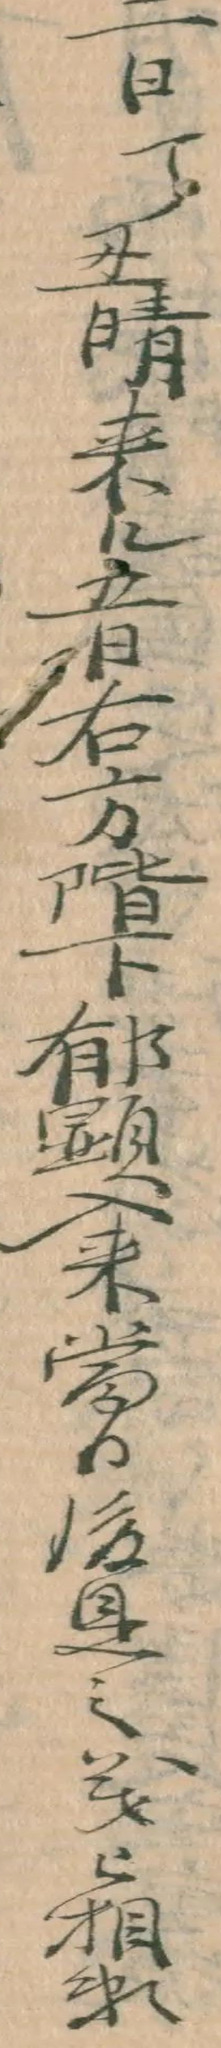二日丁丑晴来ル五日右方階下郁顕入来當日後見之義被相頼
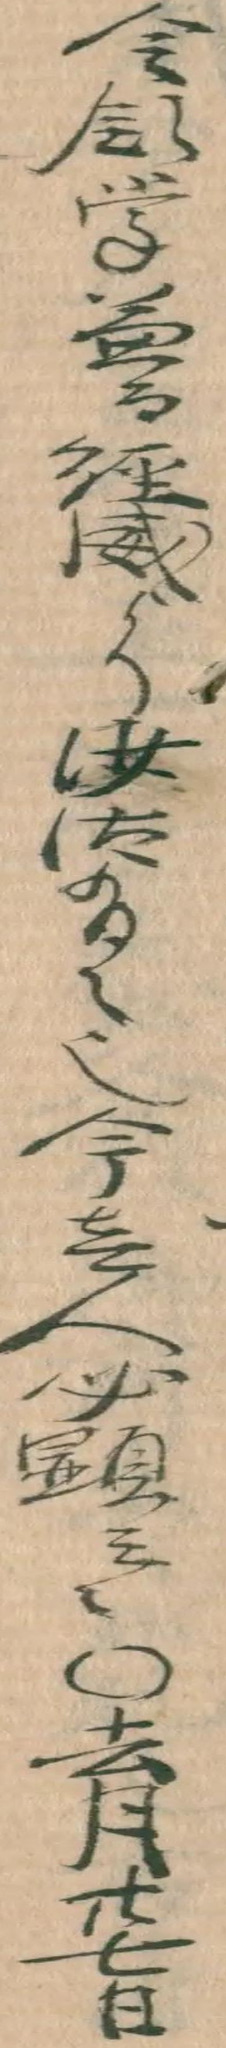令領掌兼而經威より沙汰有之也今壱人必顕云〻〇去月廿七日
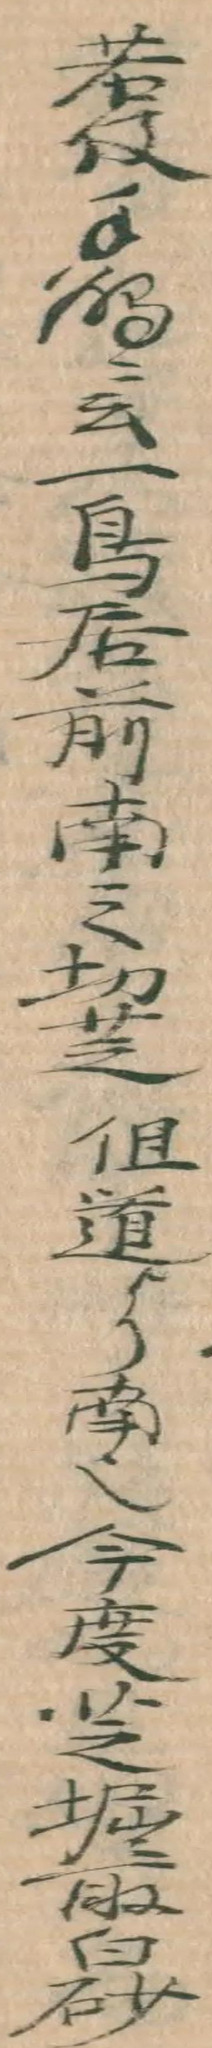若役手触ニ云一鳥居前南之切芝但道より南也今度芝堀取白砂
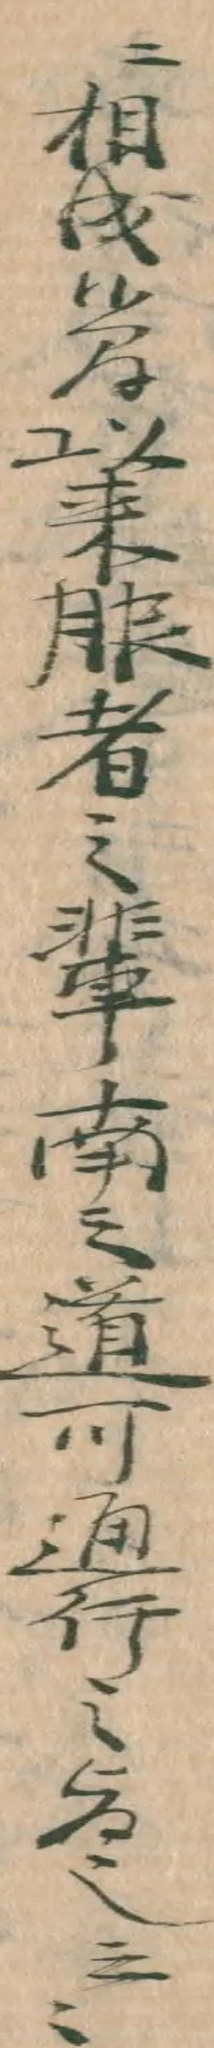ニ相成候間以来服者之輩南之道可通行之旨也云々
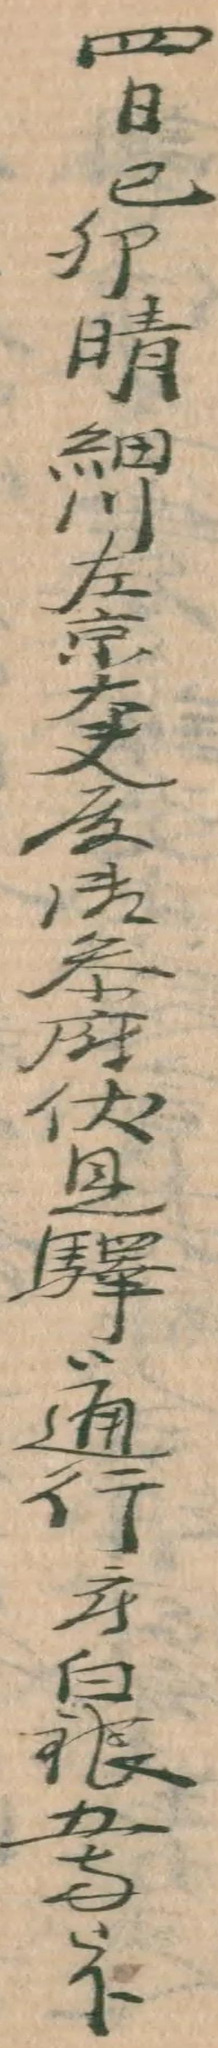四日己卯晴細川左京大夫殿御参府伏見驛御通行ニ付白銀五両被下
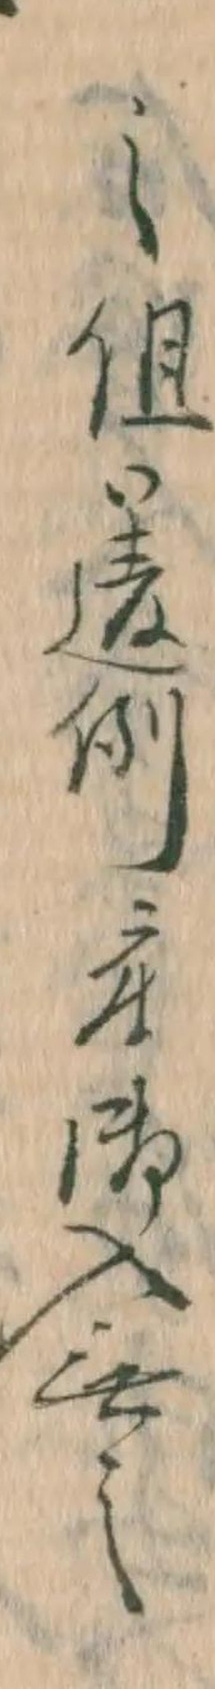之但御違例ニ付御入無之
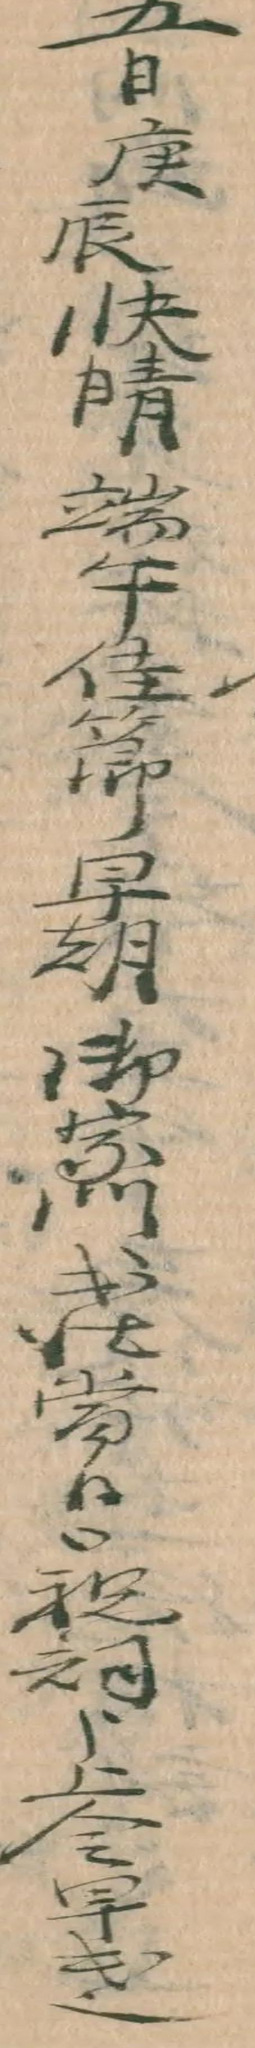五日庚辰快晴端午佳節早朝御家門へ出仕當日祝詞申上令早義也
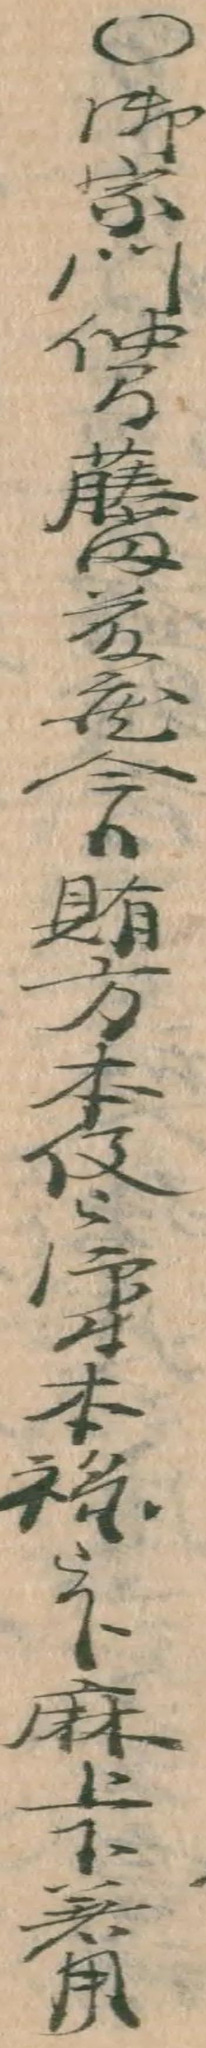○御家門仲間藤田藤蔵今日賄方本役被仰付本禄被下麻上下着用
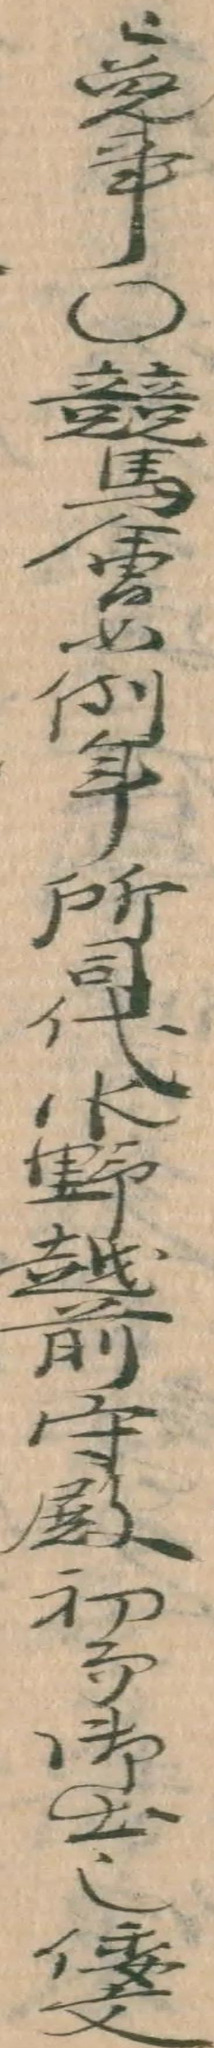被免事○競馬會如例年所司代水野越前守殿初而御出也倭文
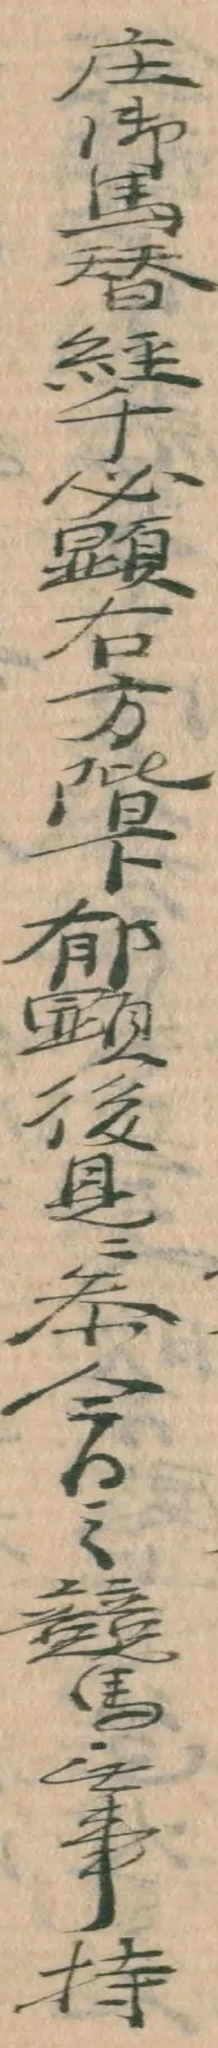庄御馬替経千必顕右方階下郁顕後見ニ参今日之競馬無事持
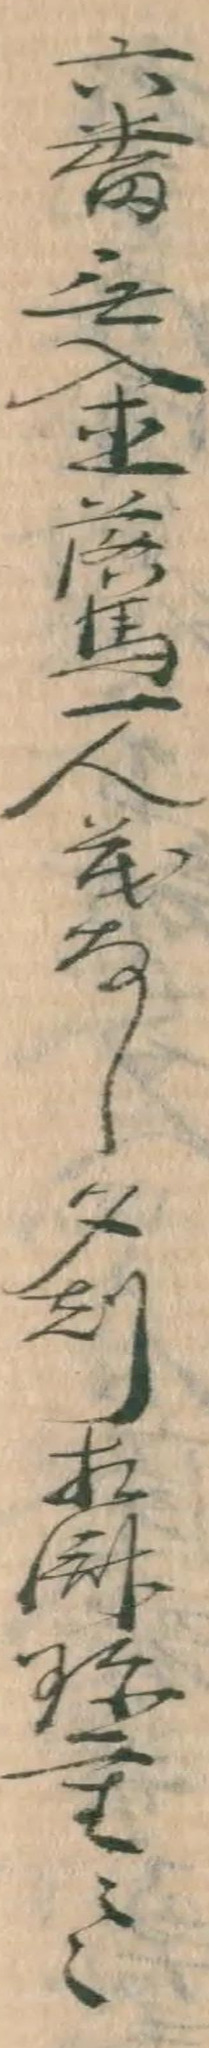六番無入直落馬一人もなし夕刻相済珍重〻〻
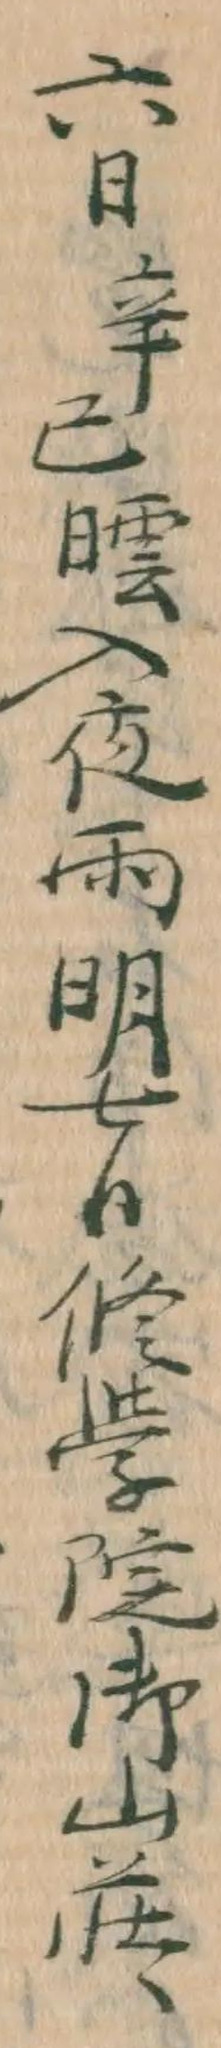六日辛巳曇入夜雨明七日修学院御山荘へ
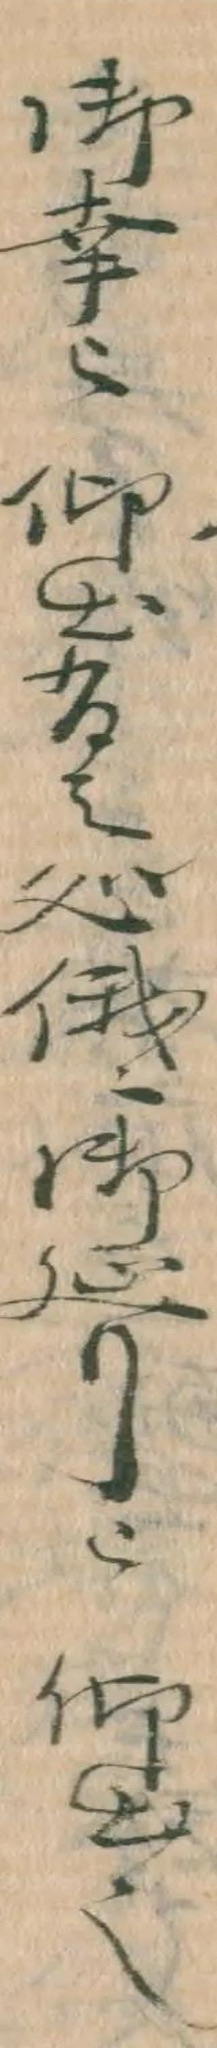御幸被仰出有之処俄ニ御延引被仰出也
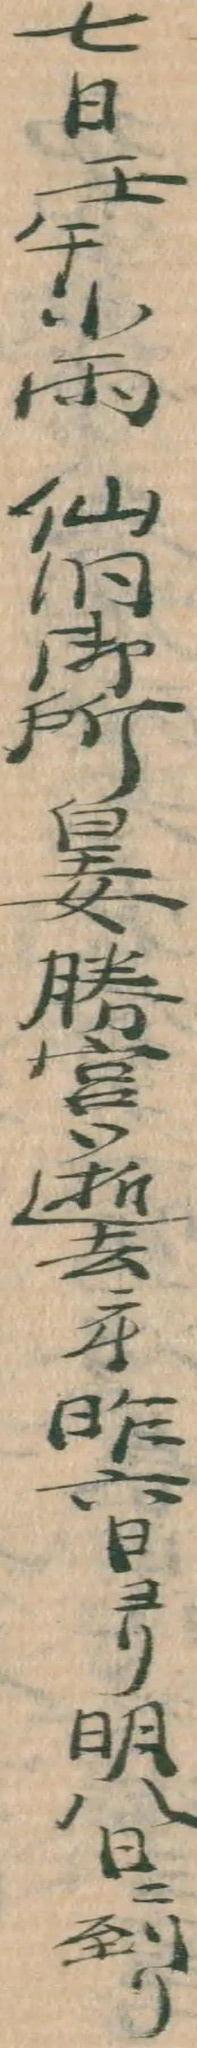七日壬午小雨仙洞御所皇女勝宮御逝去ニ付昨六日ヨリ明八日ニ到リ
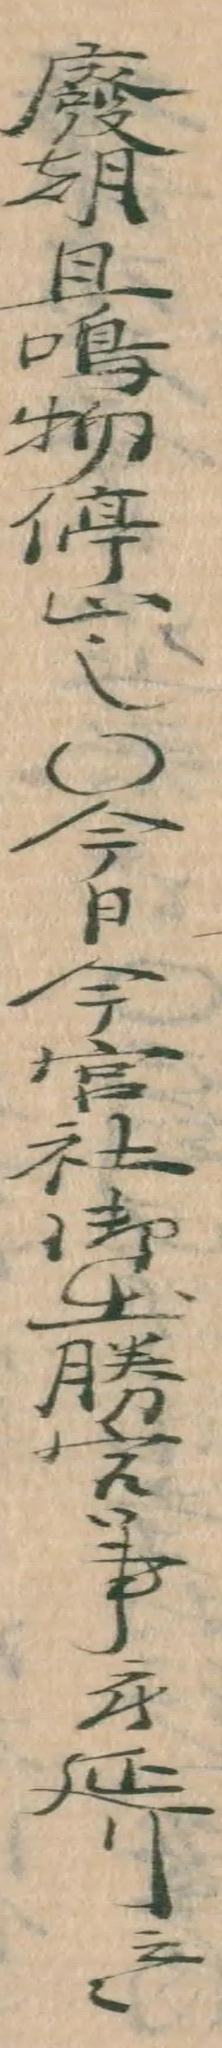廃朝且鳴物停止也○今日今宮社御出勝宮御事ニ付延引云々
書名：賀茂社記録. 第65冊
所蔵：国立国会図書館 National Diet Library, JAPAN
